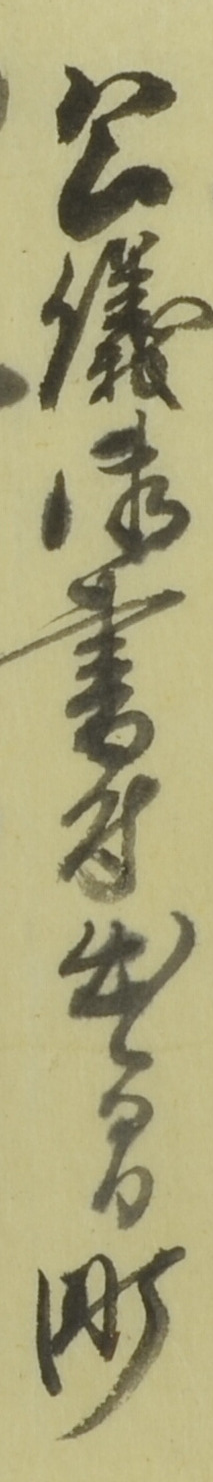公儀御書付出候間町
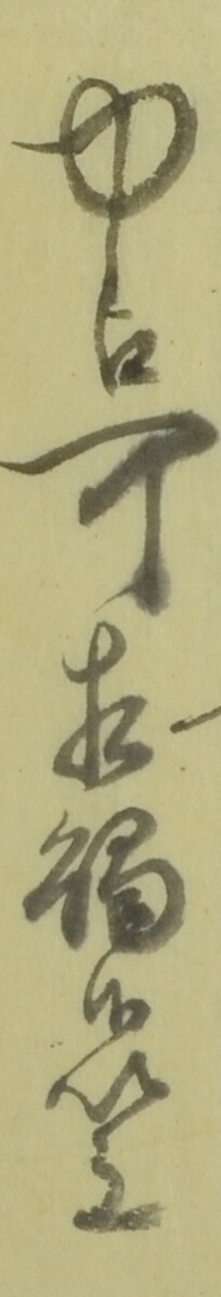中江可相触候以上
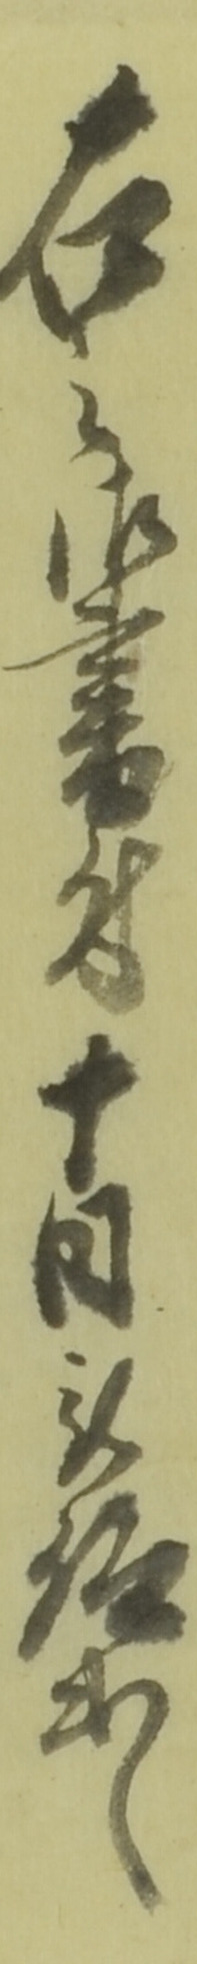右之御書付十日被仰出候
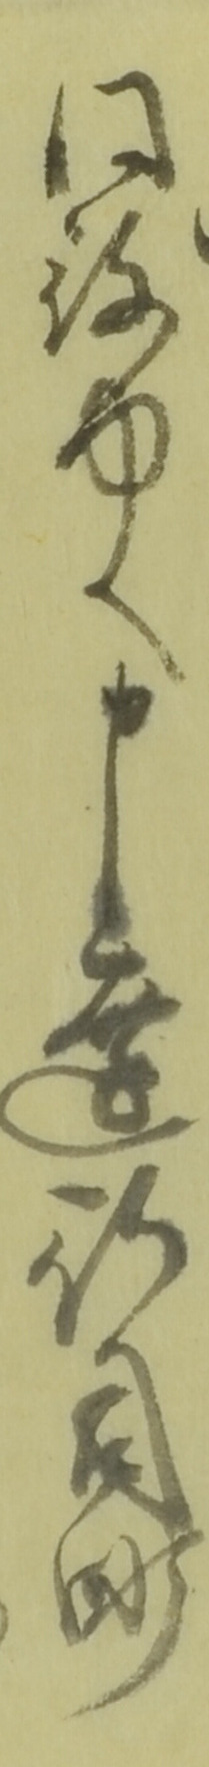同役中へ申達行司町
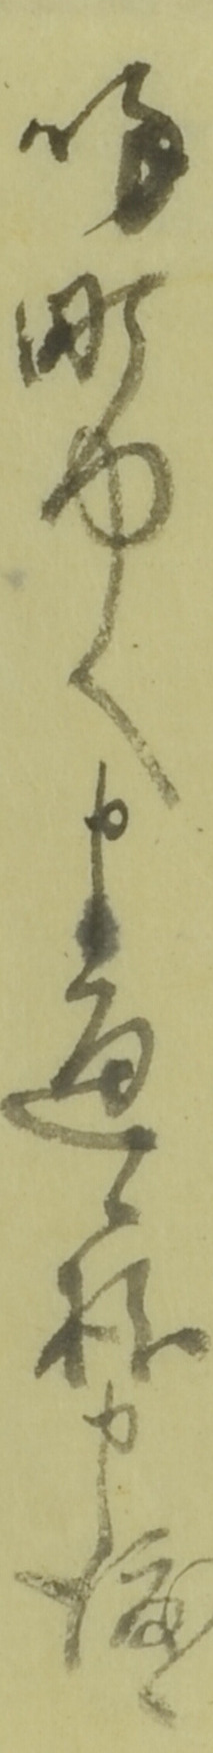呼町中へ申通候様申渡候
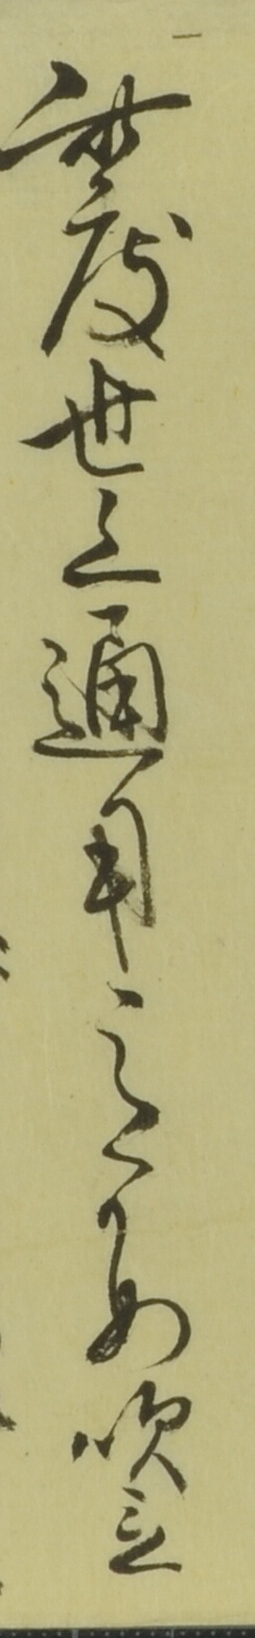此度世上通用之ため吹立
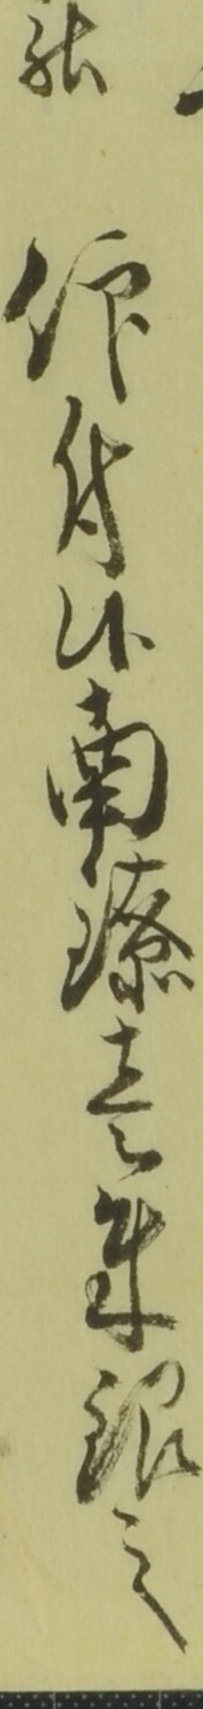被仰付候南鐐壱朱銀之
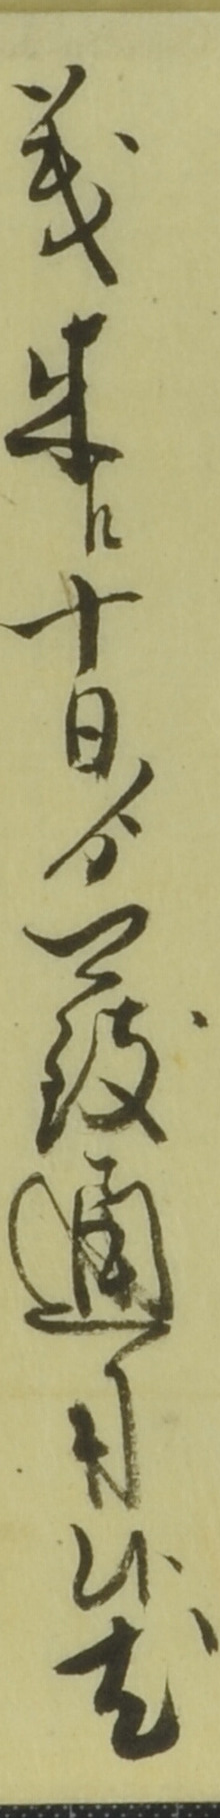義来ル十日ゟ可致通用候尤
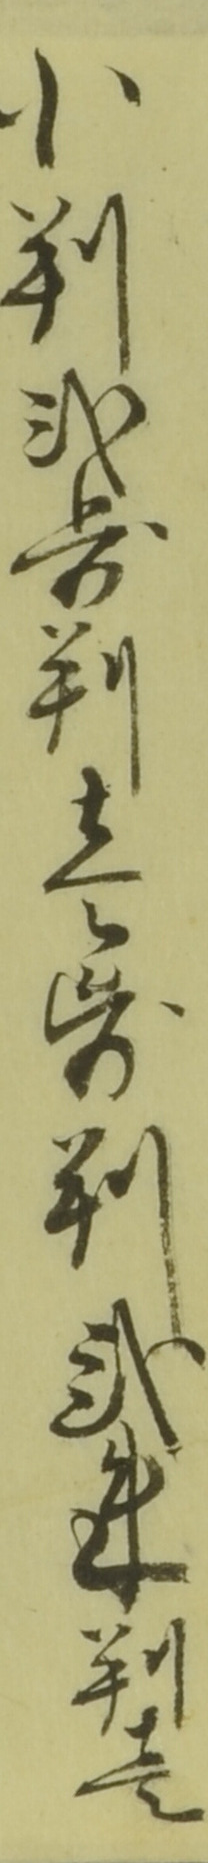小伴弐歩判壱歩判弐朱判壱
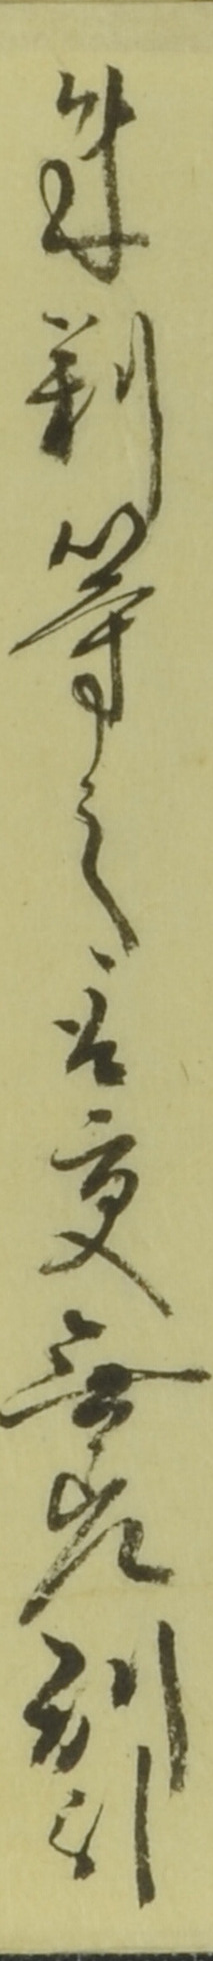朱判等之取交無差別引

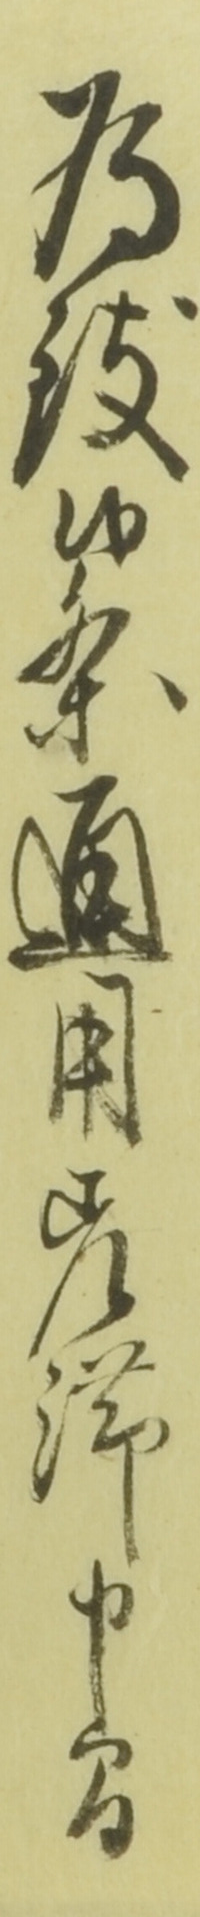為致候条通用差滞申間
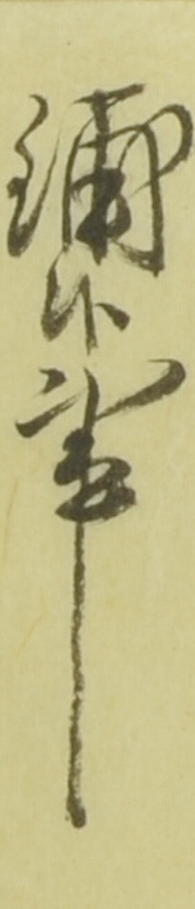舗候事
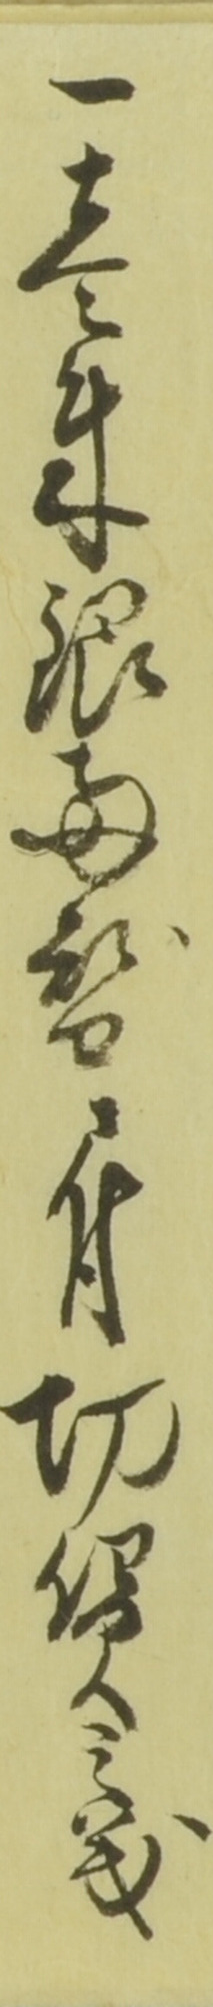一壱朱銀両替ニ付切賃之義
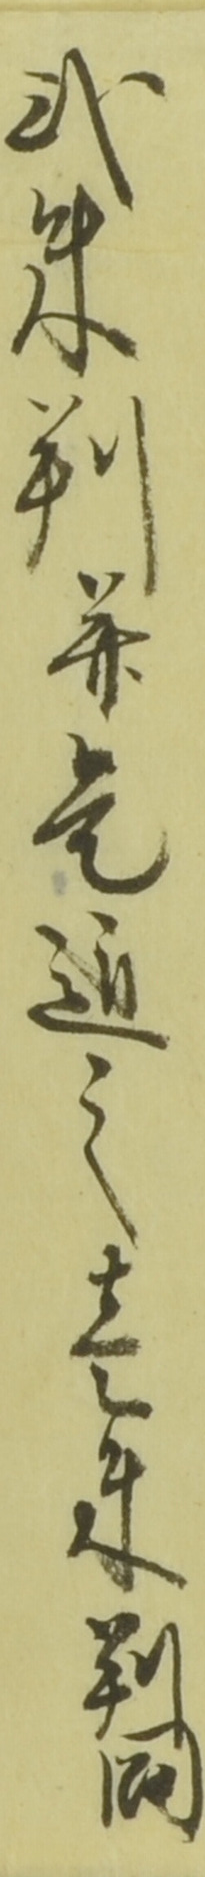弐朱判并是迄之壱朱判同
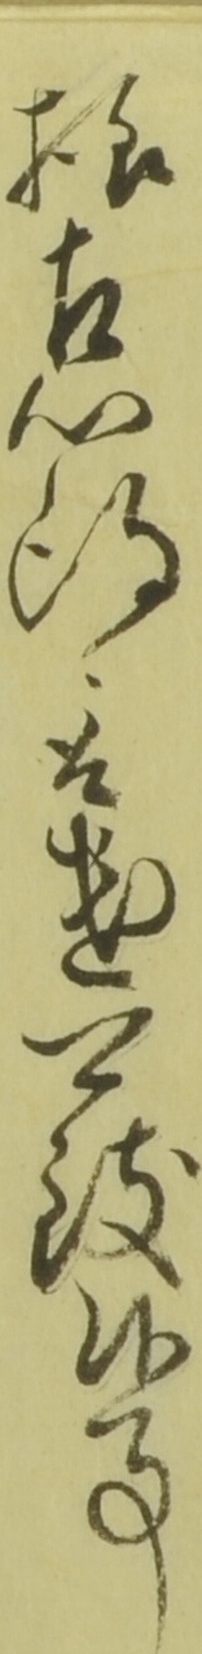様相心得取遣可致候事
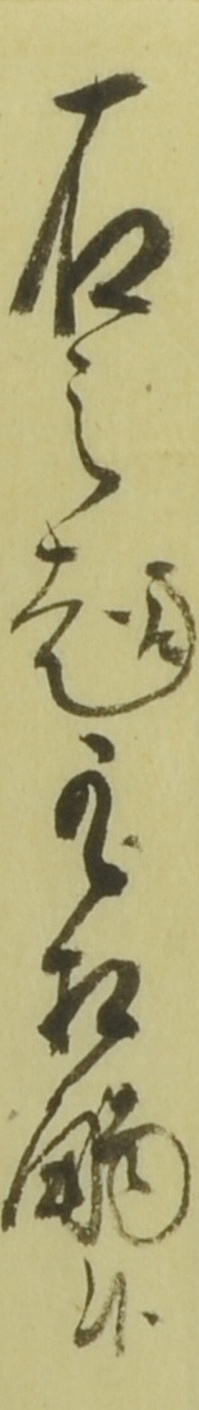右之趣可被相触候
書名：御触書御書附控
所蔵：伊那市立高遠町図書館・合同会社AMANE
